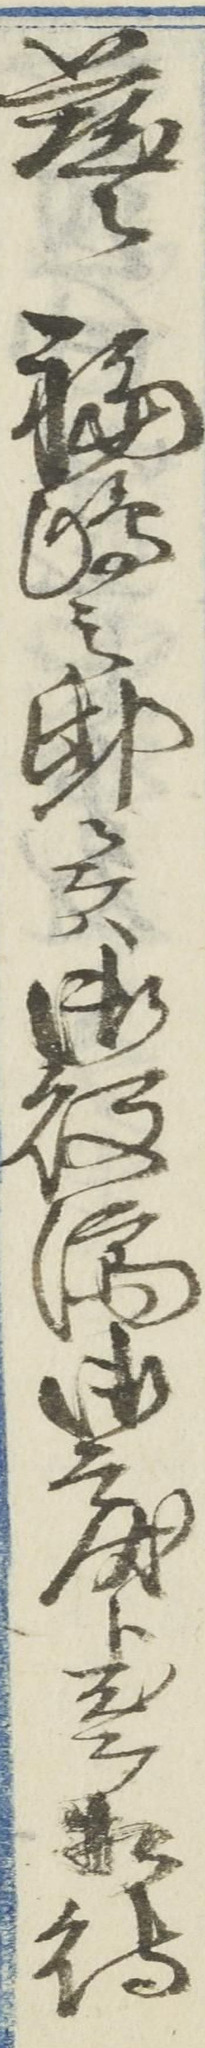蔵ニ福島之邸ニテハ御役済御戻ト云テ相待
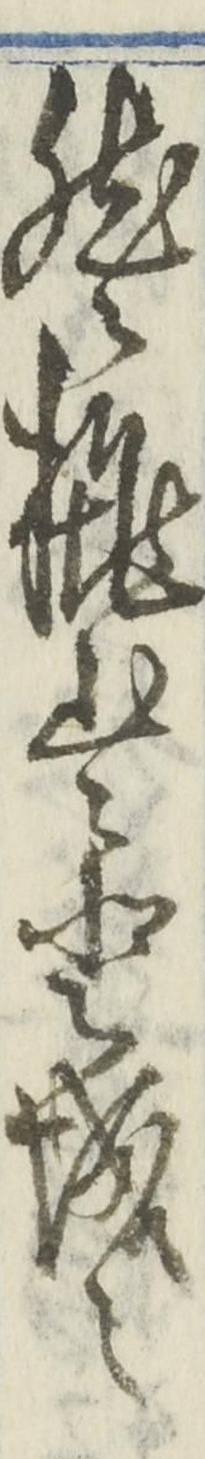然ニ桃山ニ登城シ
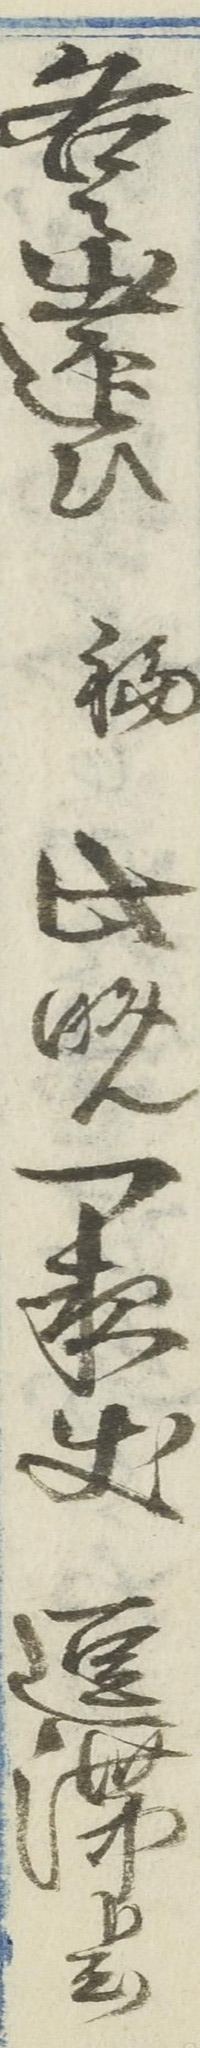各々出迎ひ福此晩一夜丈逗滞ト云
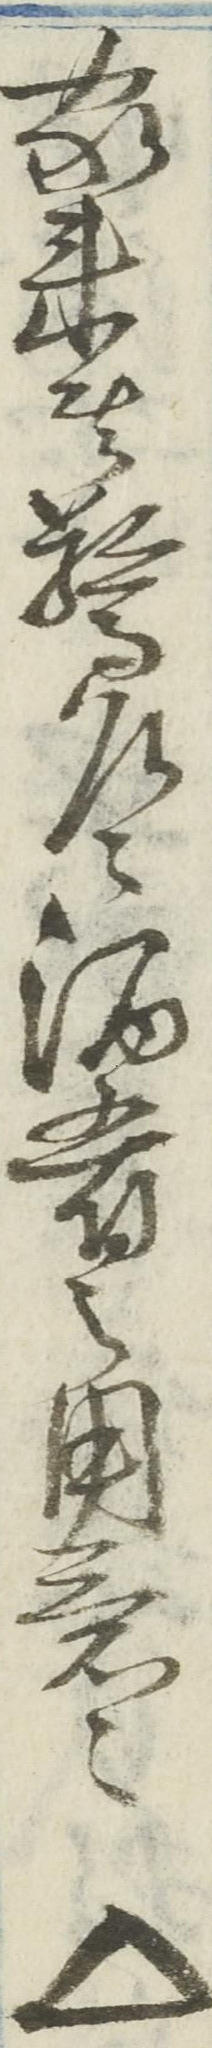家来共驚乍ニ酒肴之用意二
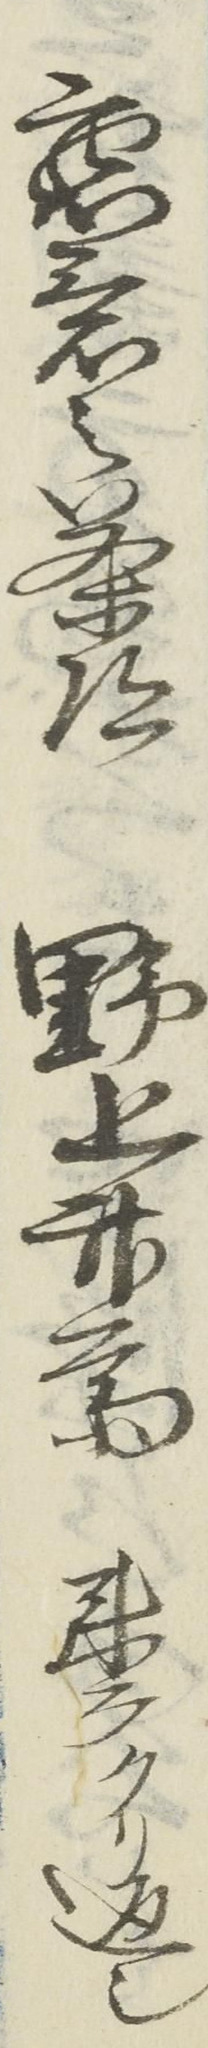石懇意之茶道野上竹齋来テクリ返シ
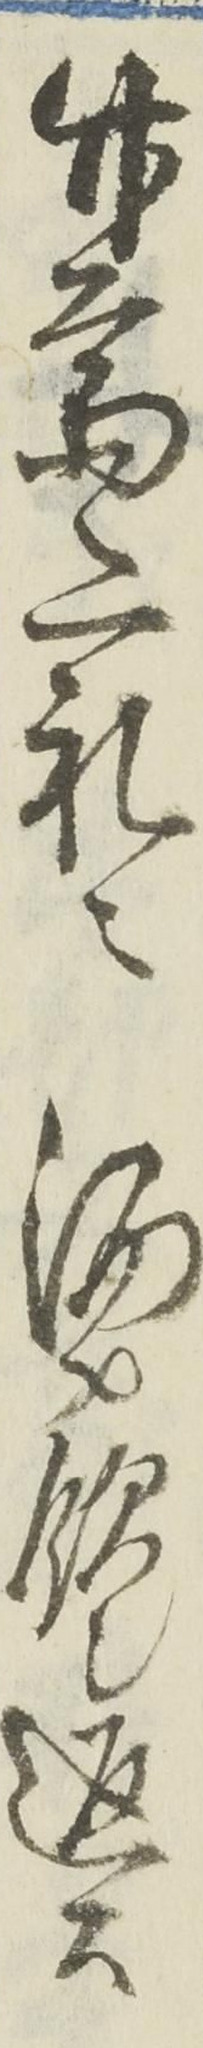竹齋二一礼之酒ヲ飲シ返ス
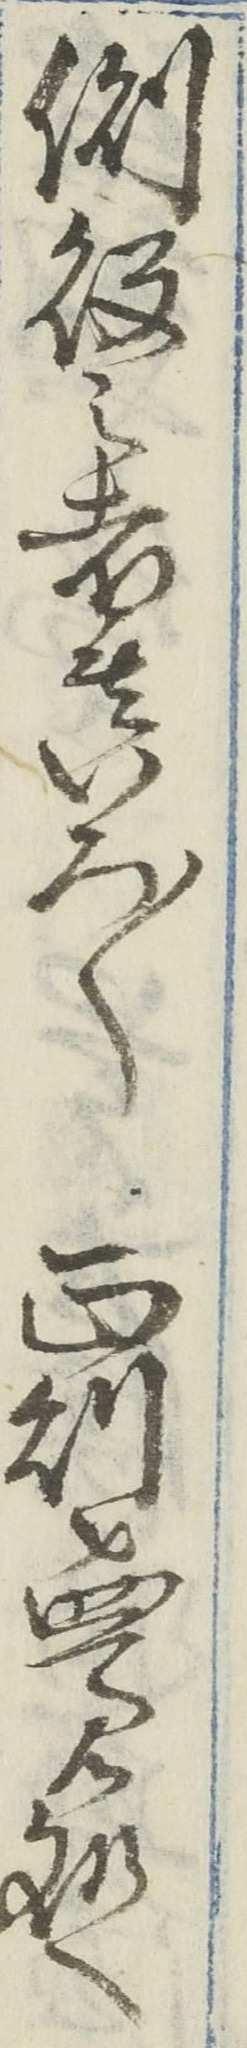側役之者共いろ〳〵正則ヲ罵ル処ヘ
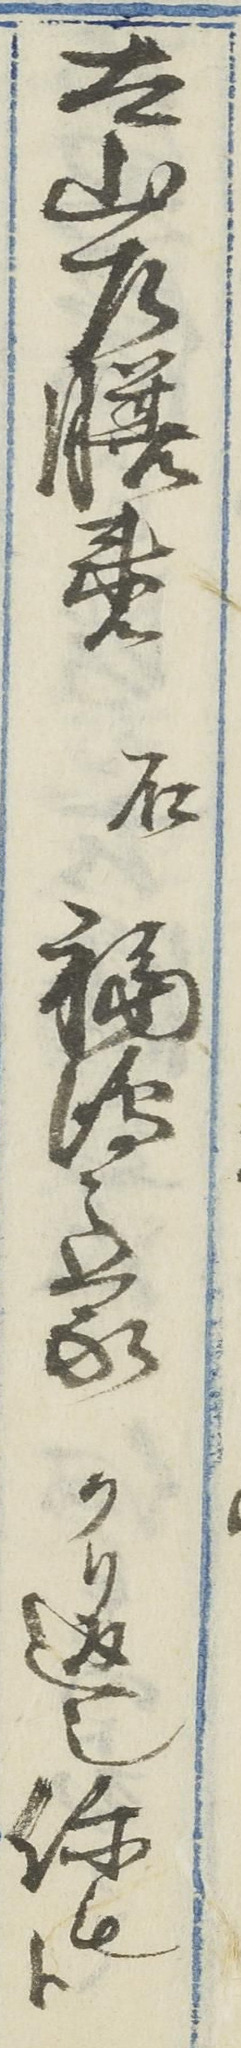太山左膳来ル石福島之義クリ返シ你モト
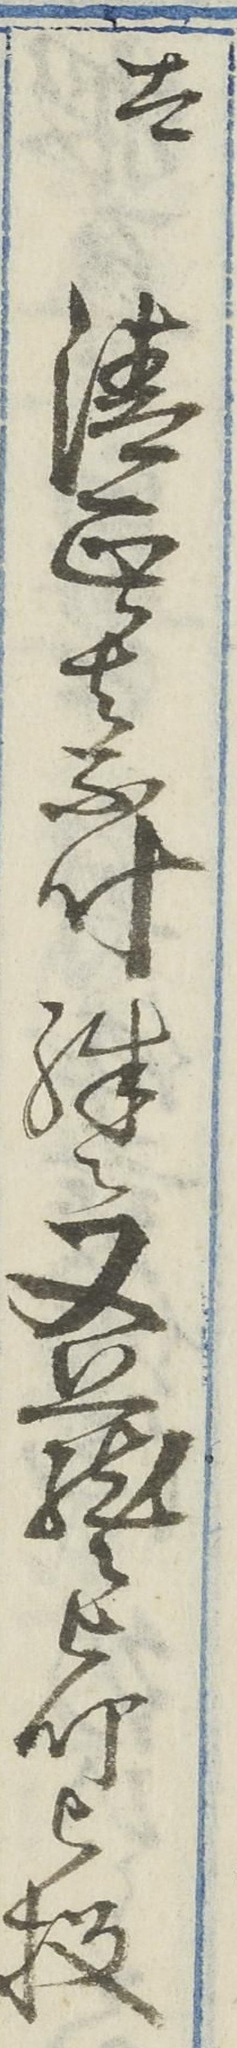太清正二は不叶殊ニ又蔵ニ被叩被投
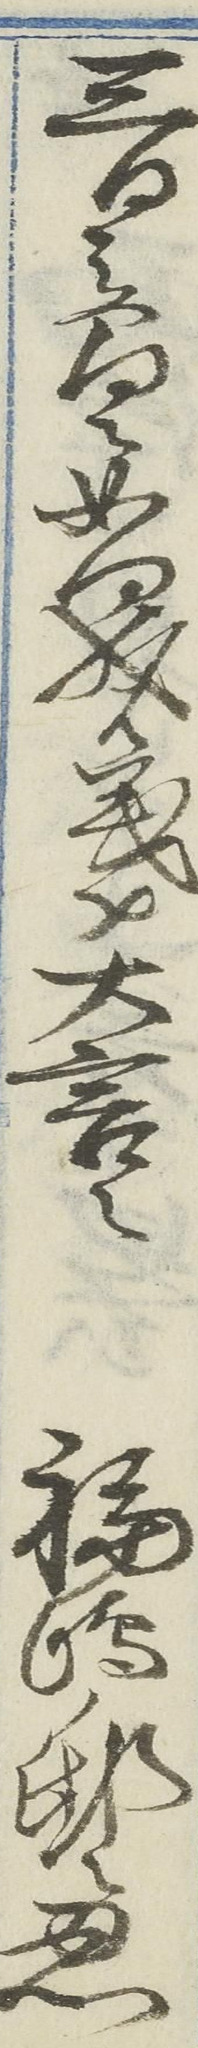三日之間ニ如何成ル義ヲ大言シ福島邸ニ忍
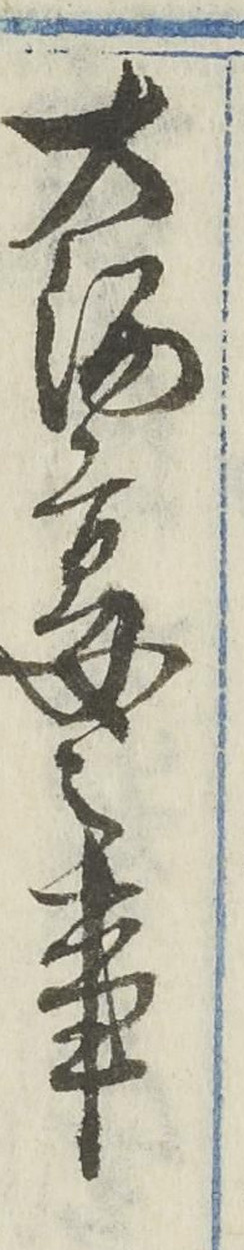大酒宴之事
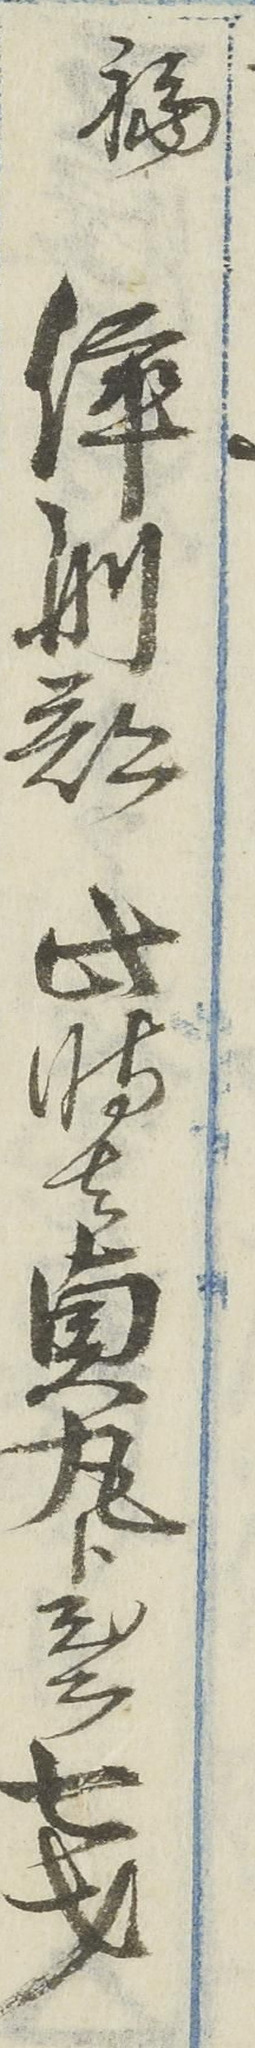福倅則部此時ハ貞丸ト云テ七才
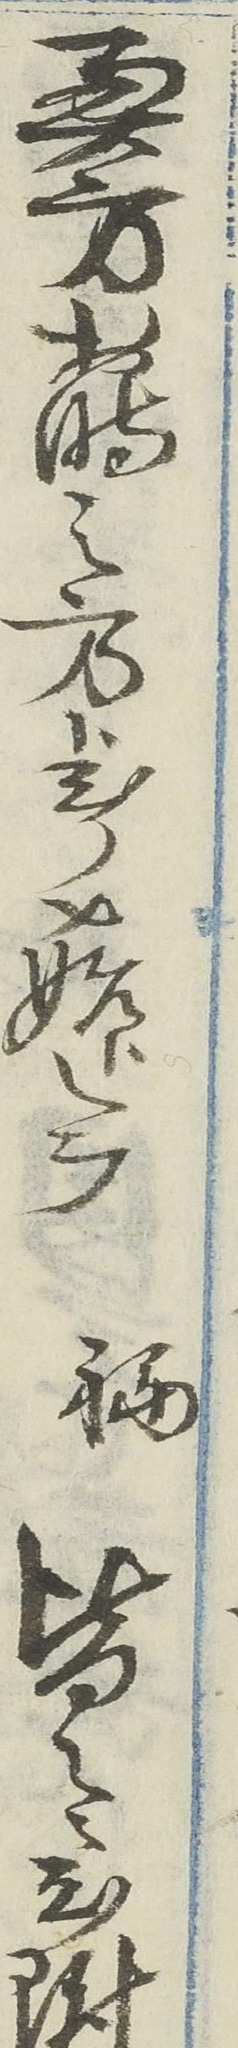奥方お時之方ト云ウヲ始トシテ福皆々ニ云附
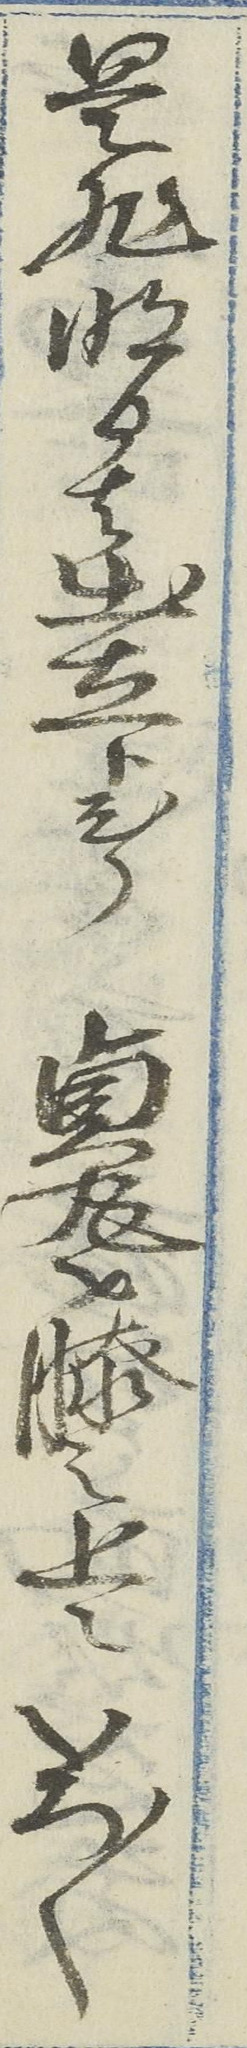是非明日ハ出立ト云ウ貞丸ヲ膝之上ニいろ〳〵
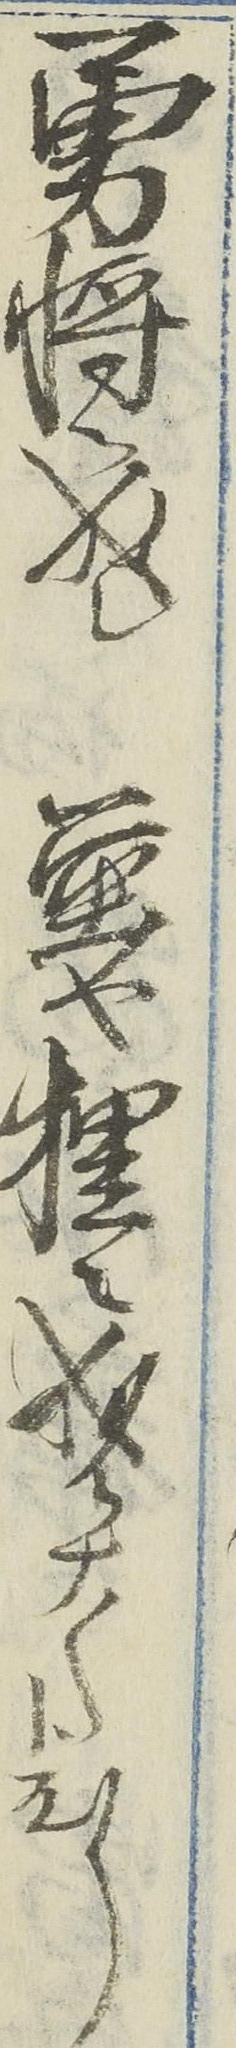勇将ニ成レ蛍ヤ狸ニ成ルナ〳〵ト云ウ

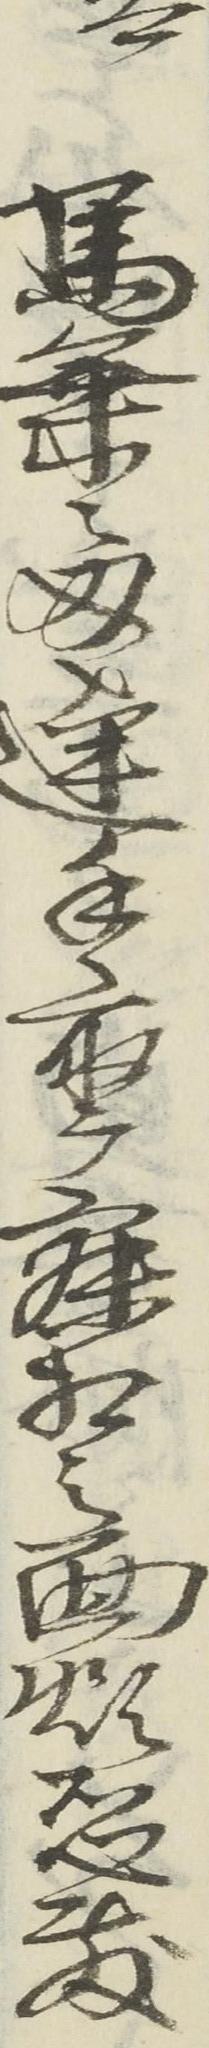太馬乗ニ刃ヲ迷手ゝ取テ寝相之面頰恐敷
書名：伏水大地震
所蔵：東京大学地震研究所図書室 Earthquake Research Institute Library, The University of Tokyo, JAPAN
